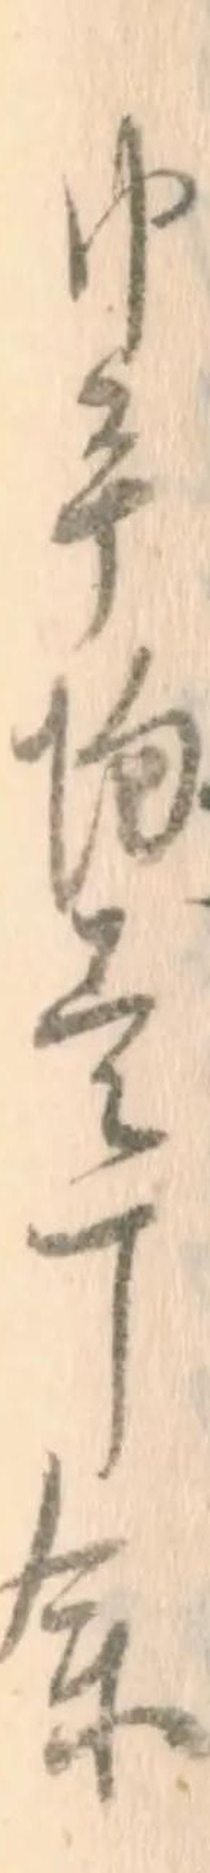幅平均壱丁余
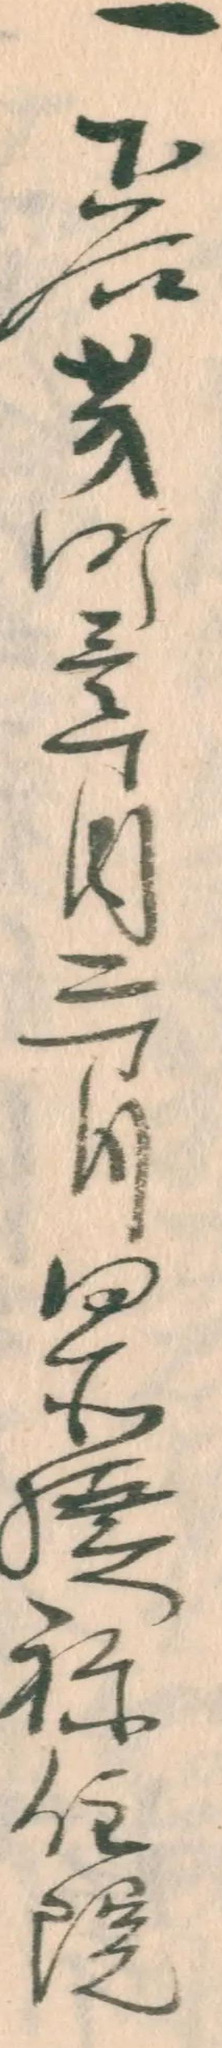一下谷寺町壱丁目二丁目同所続称住院
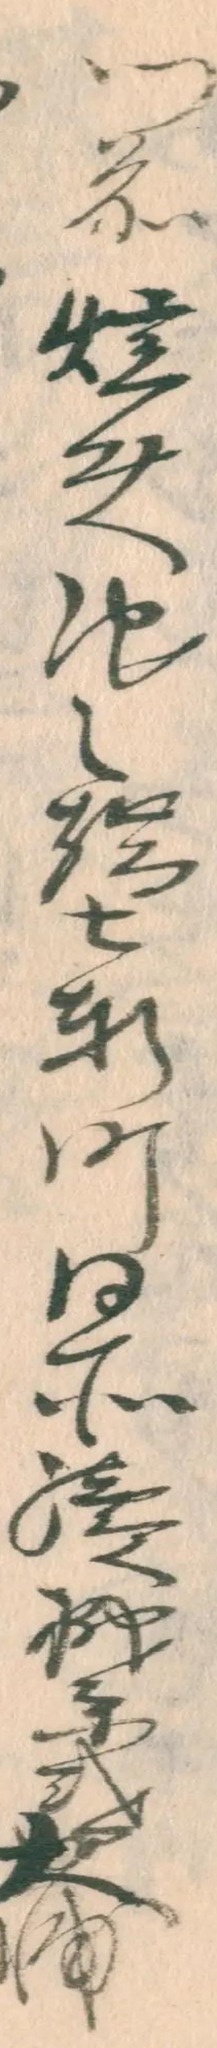門前焼失池之端七軒町同所続榊原式部大輔
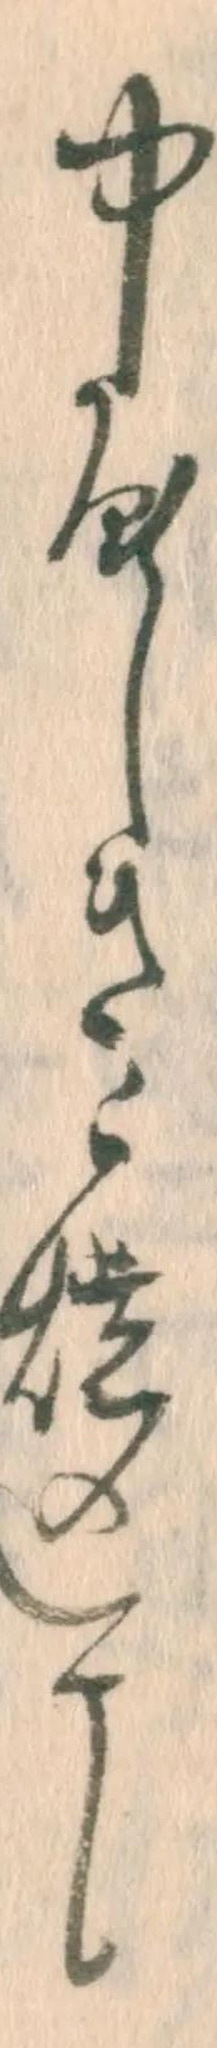中屋しき被焼込申候
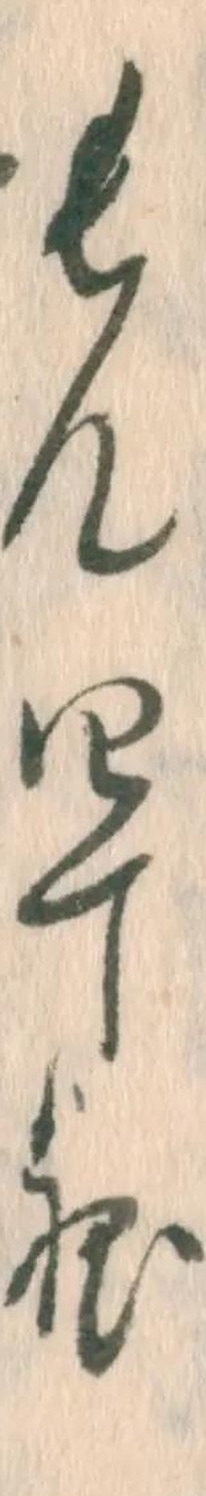長凡四丁程
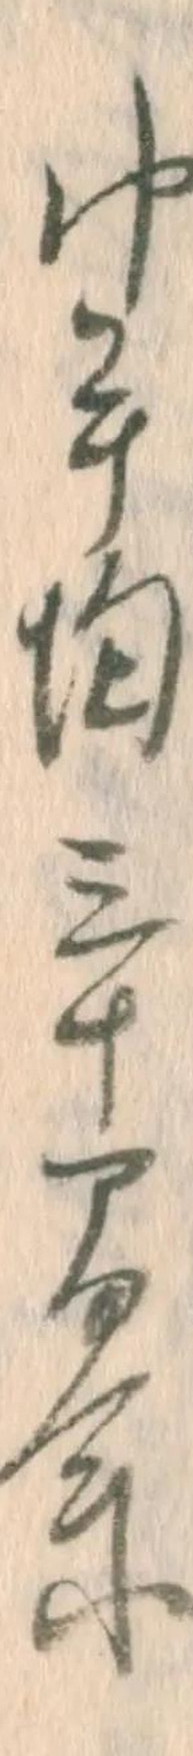幅平均三十間余
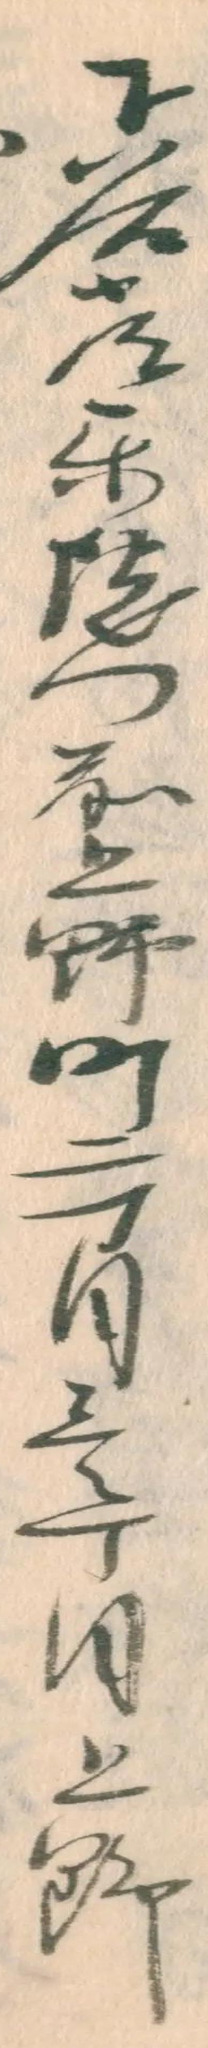一下谷常楽院門前上野町二丁目壱丁目上野
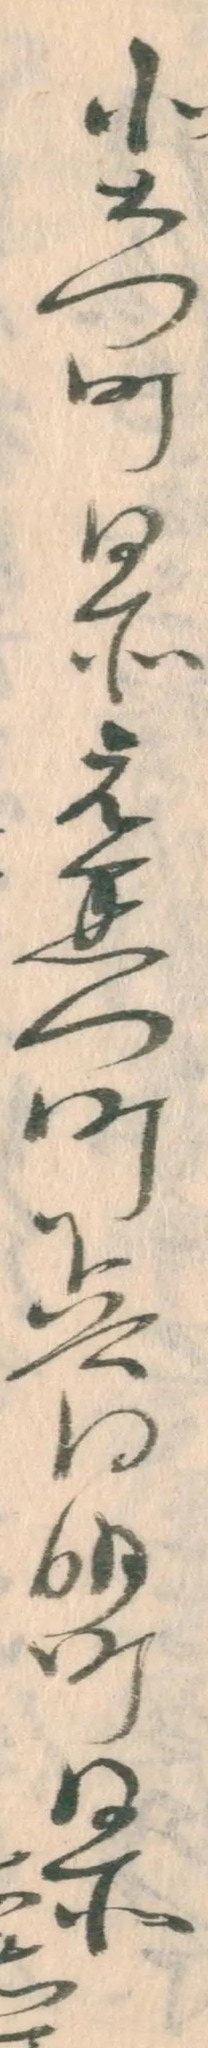北大門町同所元黒門町下谷同明町同所長者丁
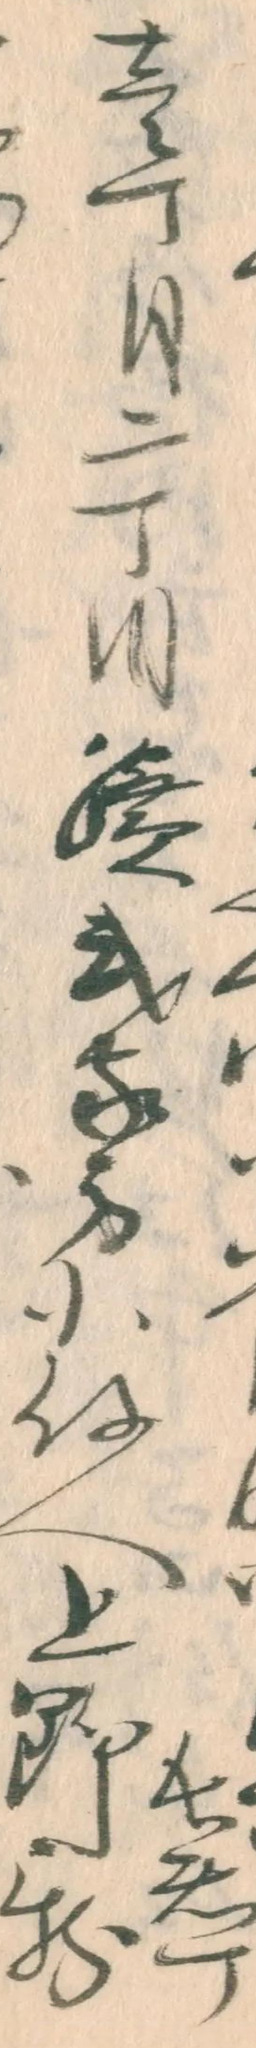壱丁目二丁目続武家方小役人上野新
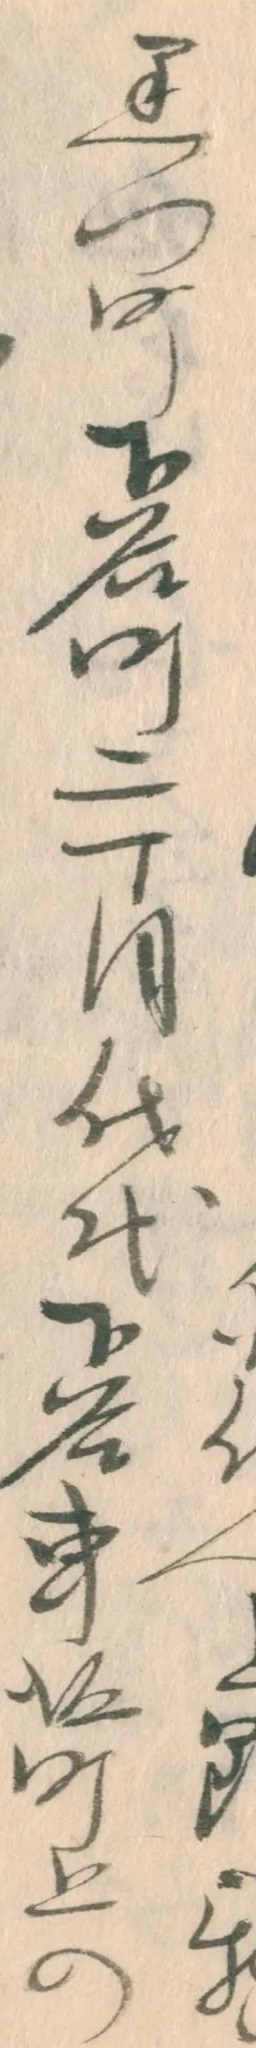黒門町下谷町二丁目代地下谷車坂町上の
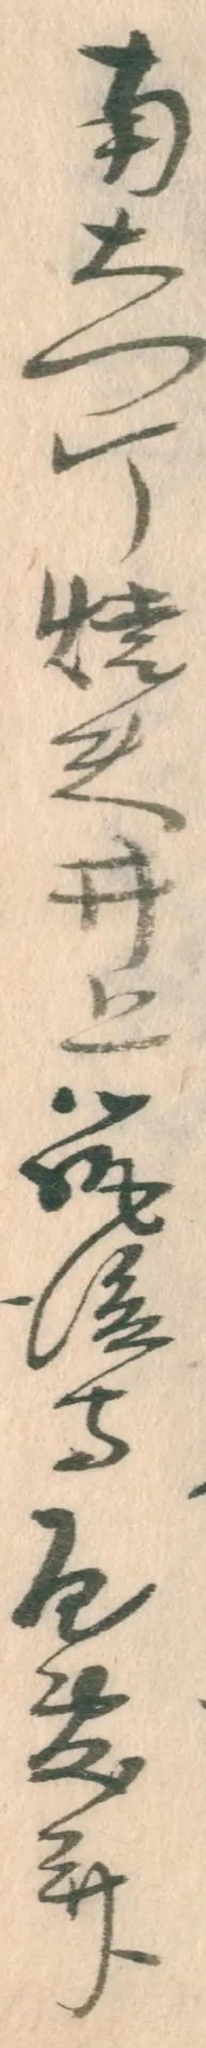南大門丁焼失井上筑後守屋敷幷

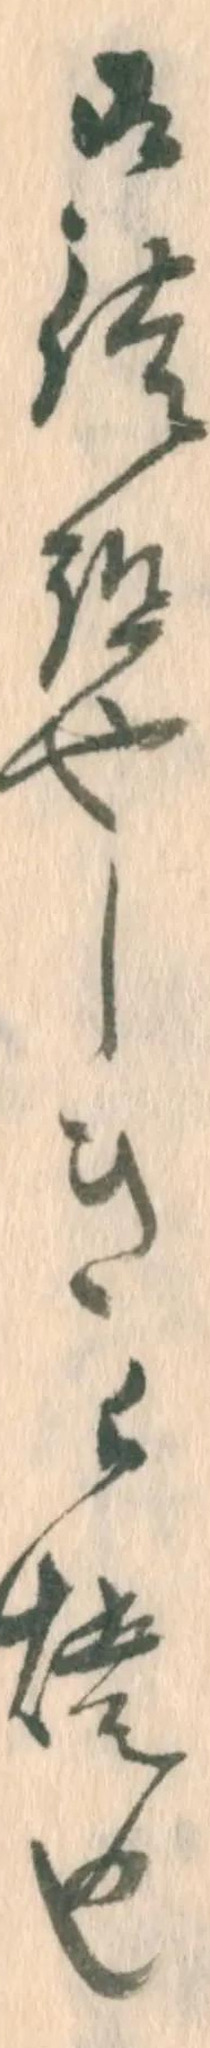御徒組やしきえ焼込
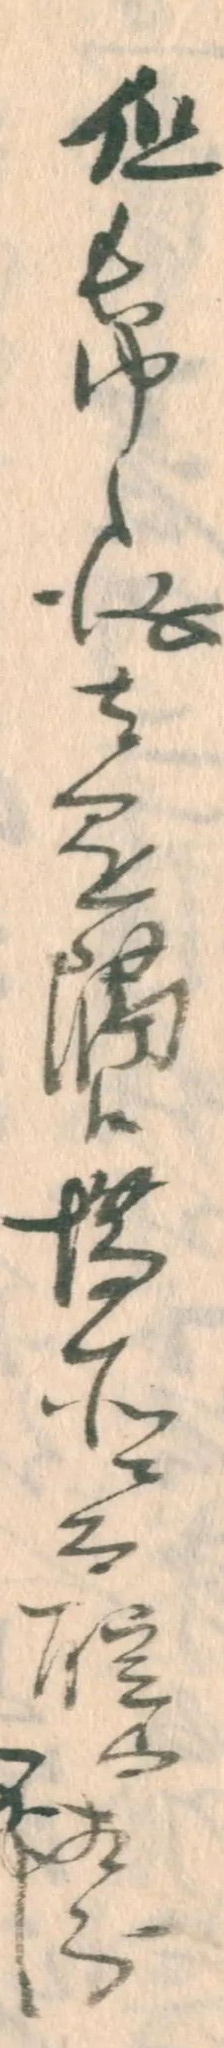但長幅之儀は懸隔候場所ニ而聢と相分不申
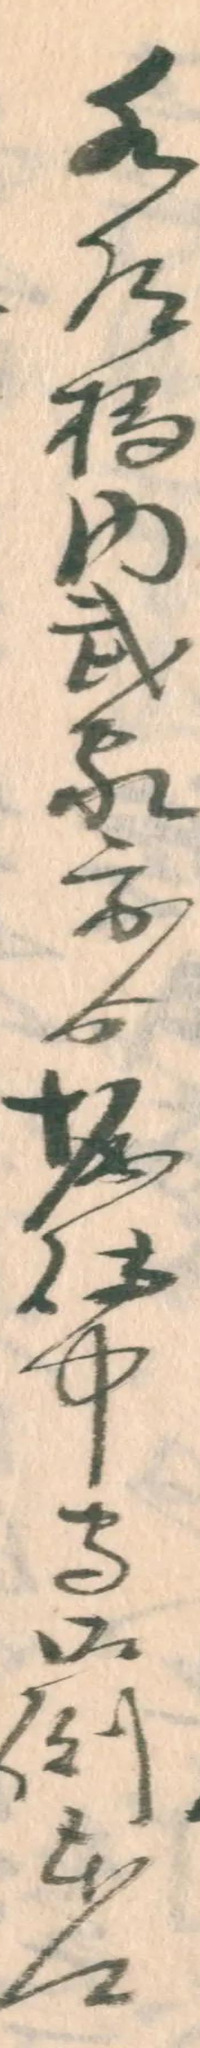一水道橋内武家方ゟ堀備中守御側本郷
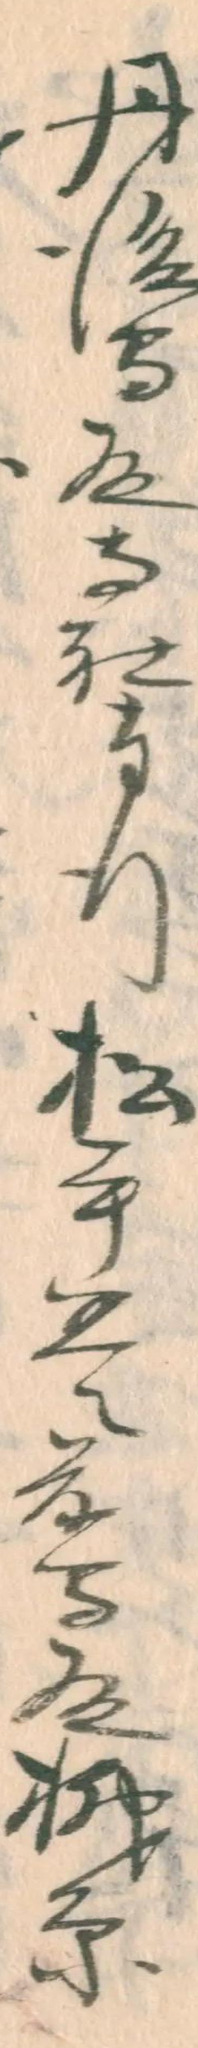丹後守殿寺社奉行松平豊前守殿柳原
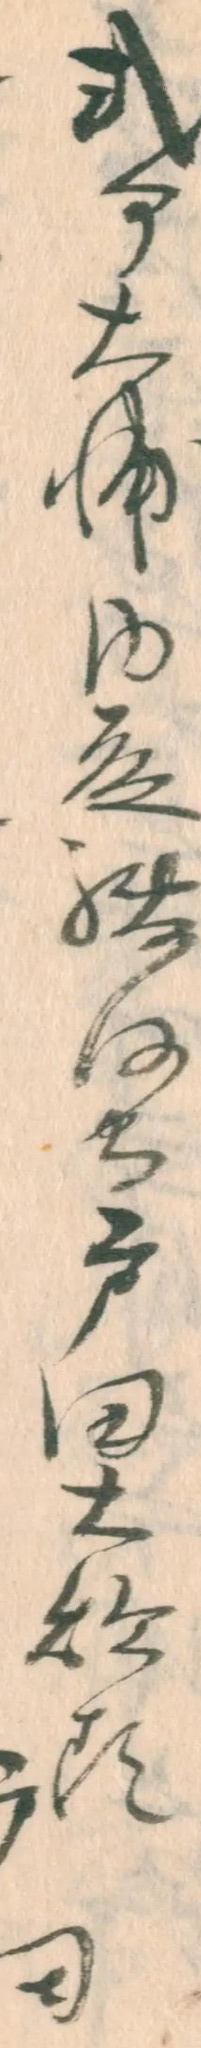式部大輔内藤駿河守戸田大炊頭戸田
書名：地震災書留 2巻. [1] 内表紙に「地震災書留　安政二卯年　但本所深川御用屋敷地代免除調」とあり
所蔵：国立国会図書館 National Diet Library, JAPAN
